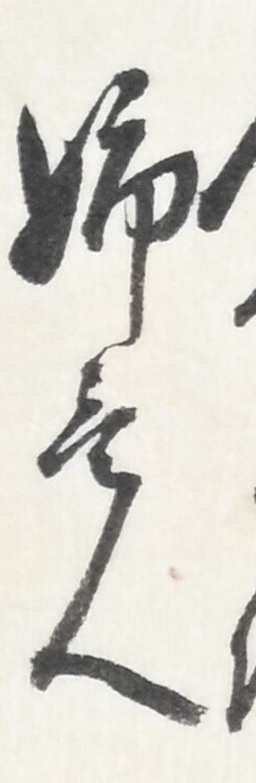姉壱人
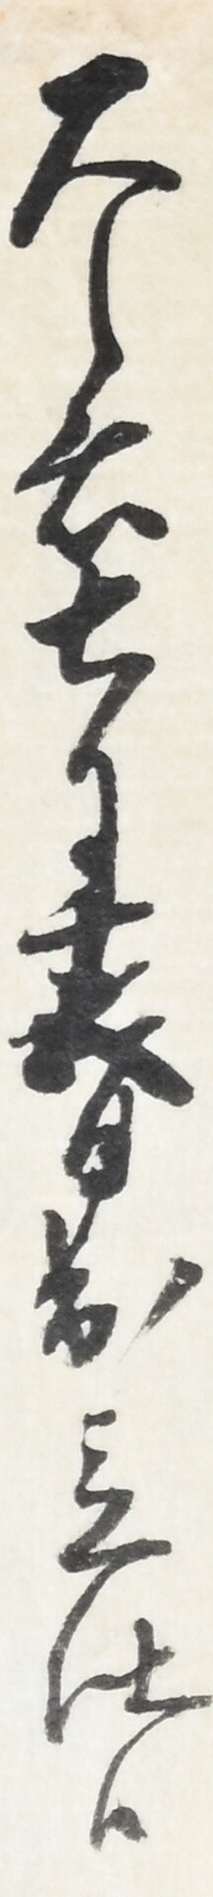右之者七月十五日出立仕候

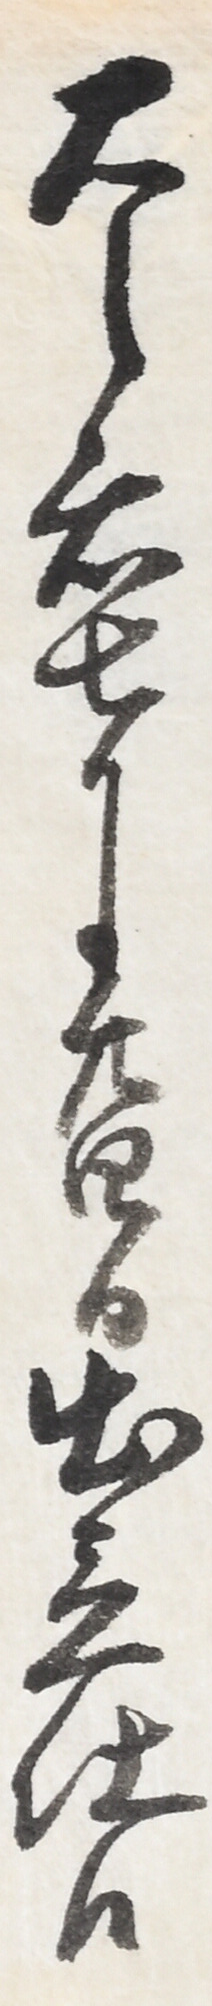右之者七月廿四日出立仕候
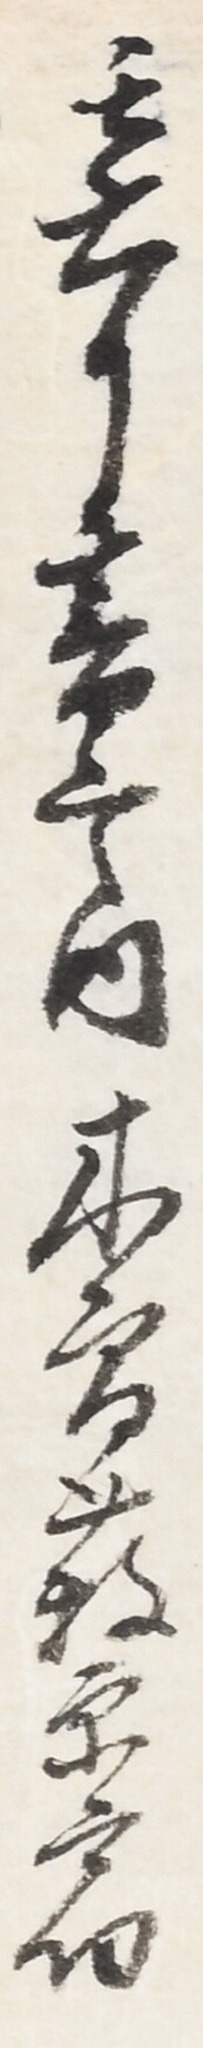壬六月書上之内木曽藪原宿
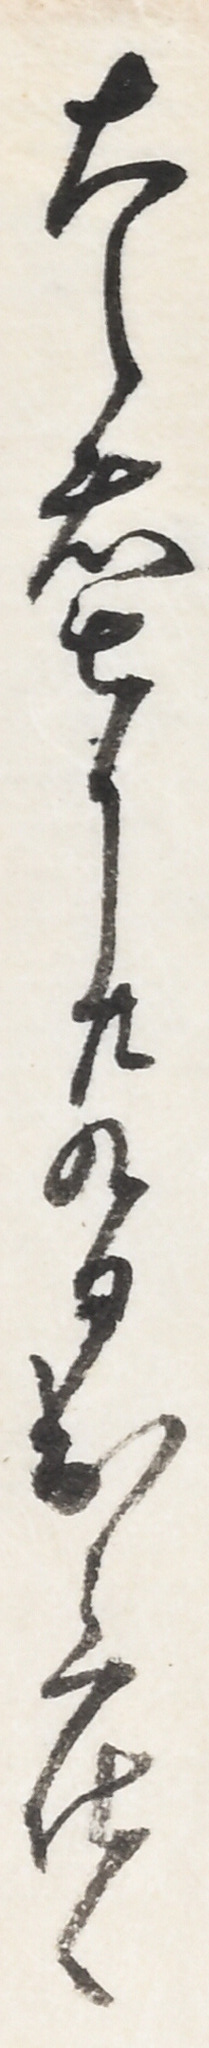右之者七月廿九日出立仕候
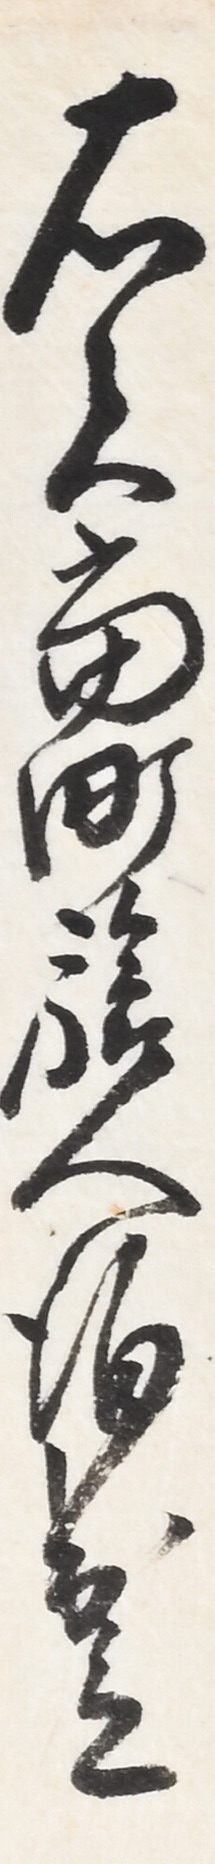右者当町旅人泊出立
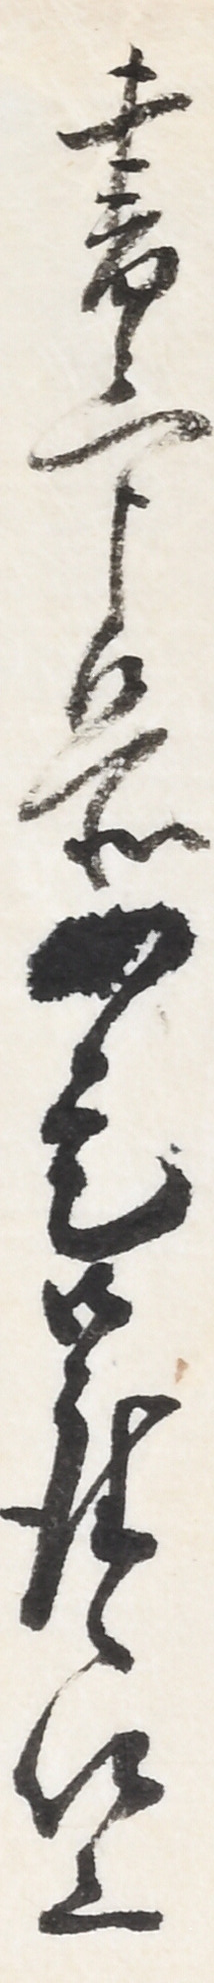書上申候所如是御座候以上
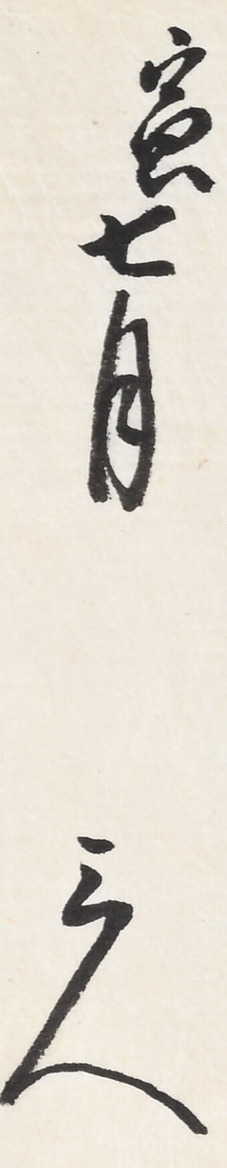寅七月三人
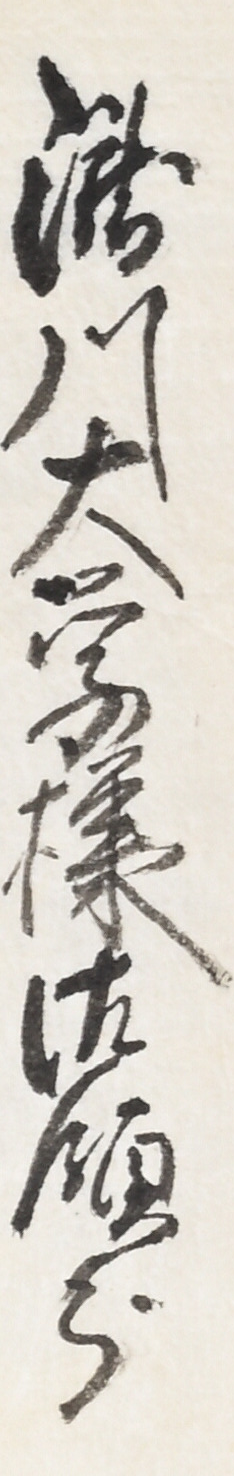瀧川大学様御領分
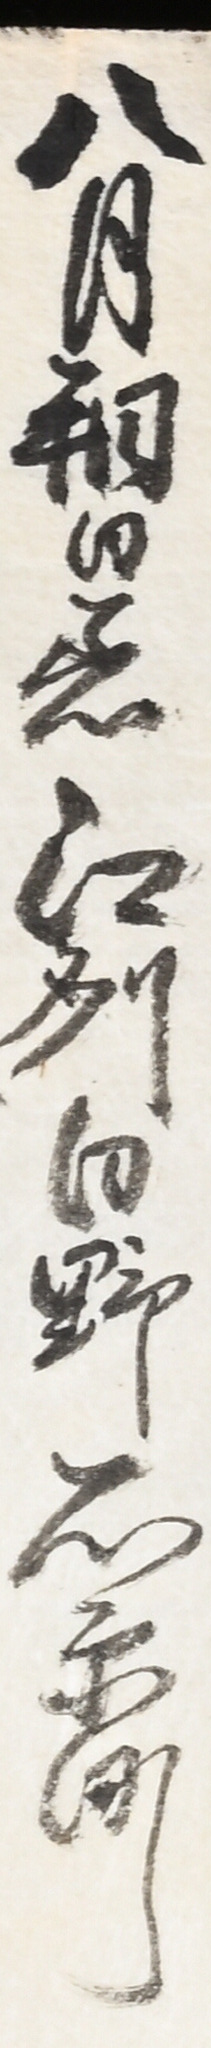八月朔日着江州日野石原町
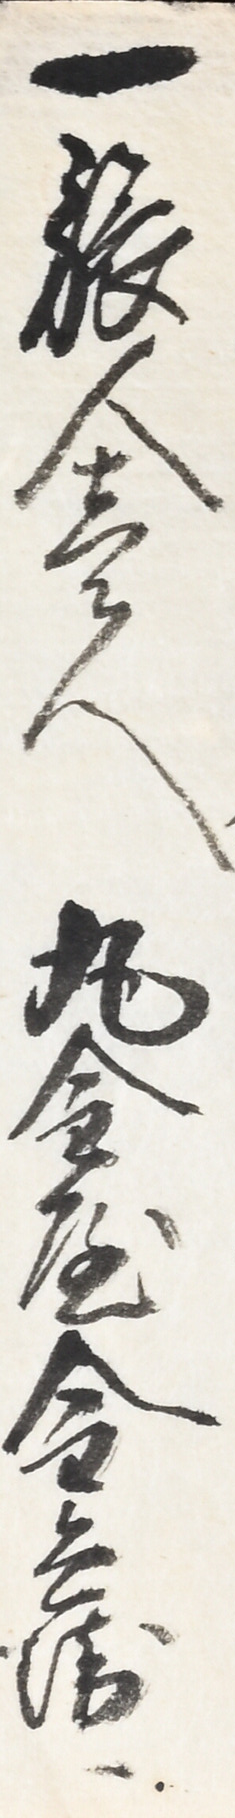一旅人壱人丸金屋金兵衛・
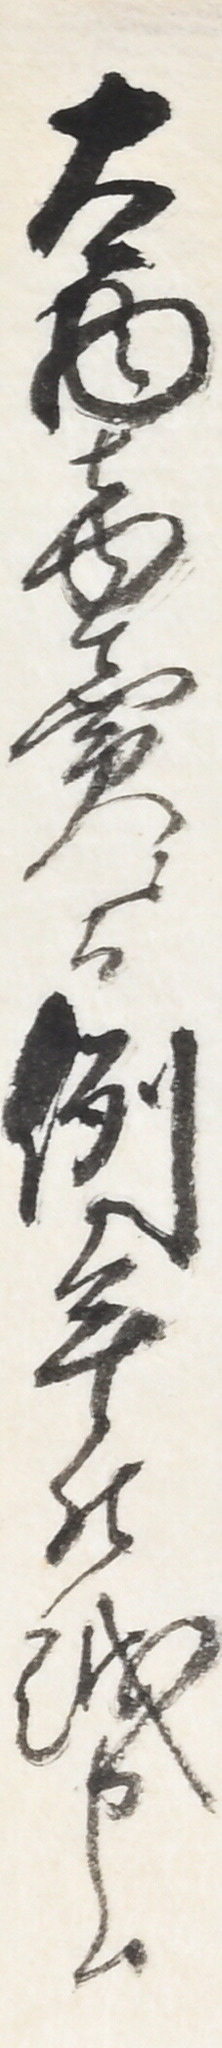太物商売ニ而例年罷越申候
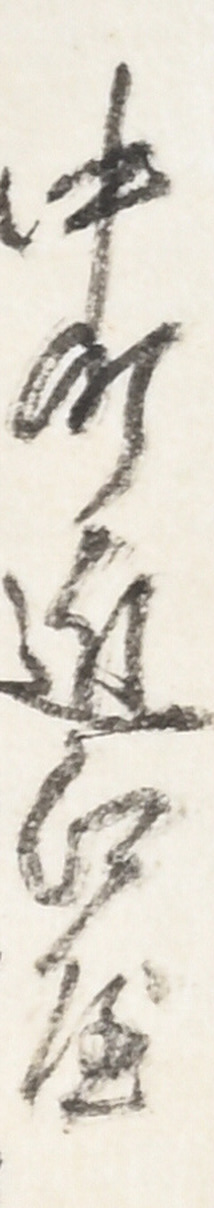中町近江屋
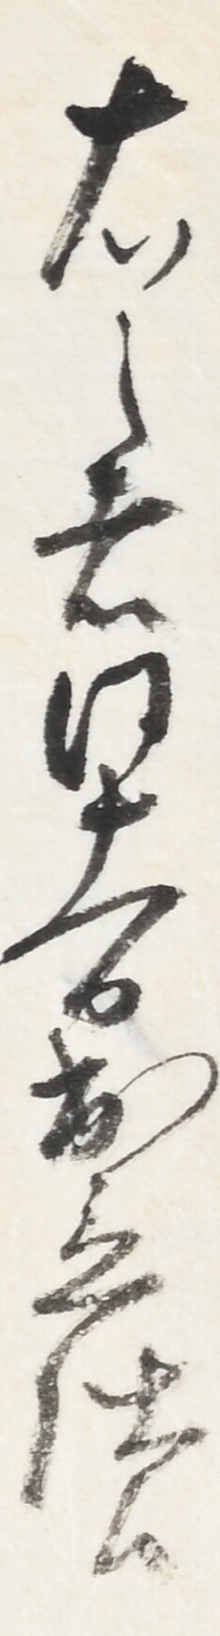右之者同十一日出立仕候
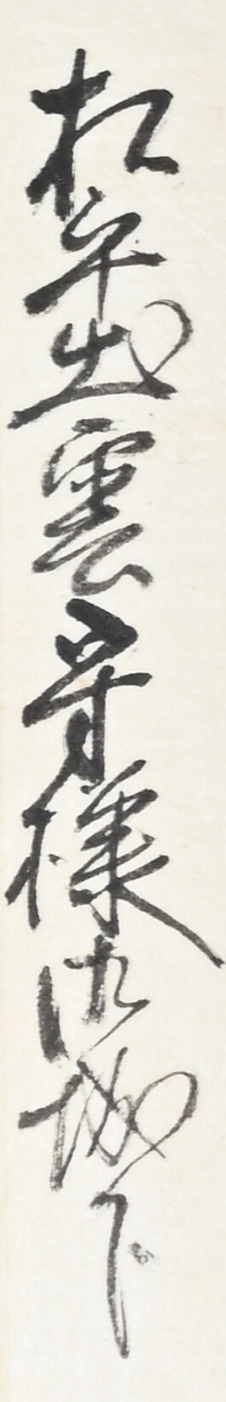松平出雲守様御城下
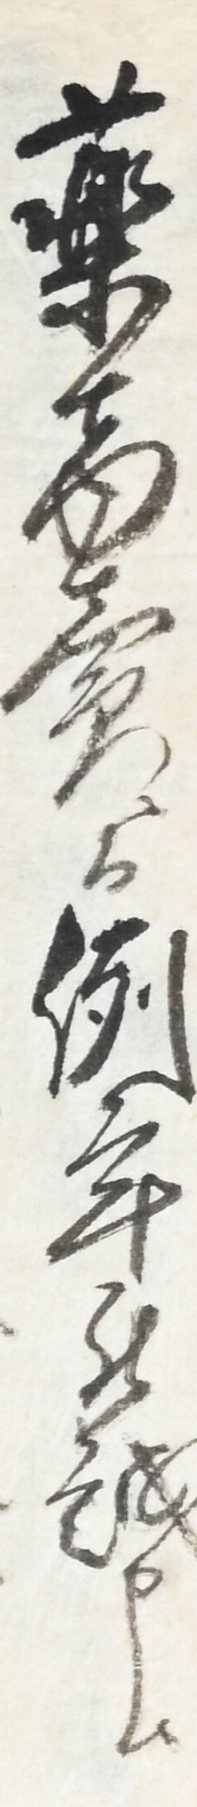太物商売ニ而例年罷越申候
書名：旅人泊控帳
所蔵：伊那市立高遠町図書館・合同会社AMANE
